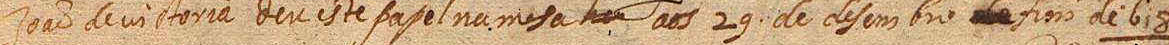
Joaõ de uictoria deu este papel na mesa hu aos 29 de desembro de fins de 618
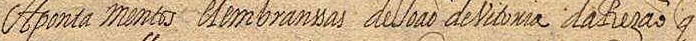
Apontamentos e lembranssas de Ioão de Vitoria da Rezão q̄
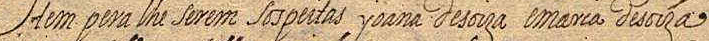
tem pera lhe serem sospeitas yoanna de soiza e maria de soiza
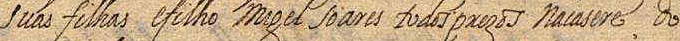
suas filhas e filho migel soares todos prezos na casere do
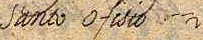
santo ofisio
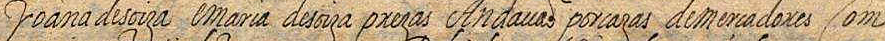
Yoanna de soiza e maria de soiza prezas Andauaõ por cazas de merçadores Com
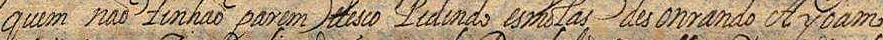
quem não tinhão paremttesço Pidindo esmolas desonrando A Yoam
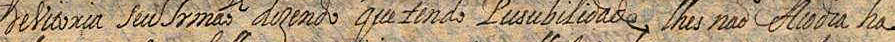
de Vitoria seu Irmaõ dizendo que tendo Pusubilidade lhes naõ Acodia ha
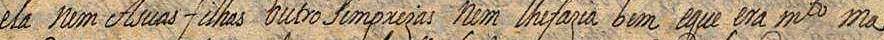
ela nem A suas filhas outro sim prezas nem lhe fazia bem e que era mto ma
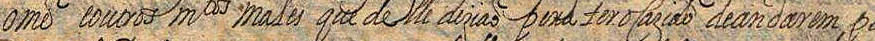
omē e outros mtos males que delle diziaõ pera ter oCaziaõ de andarem pi
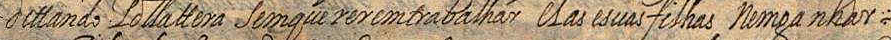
dittando Polla ttera sem quererem trabalhar elas e suas filhas nem ganhar
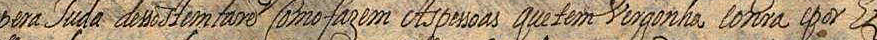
pera Iuda de ssostemtarē Como fazem As pessoas que tem Vergonha e onra e por E
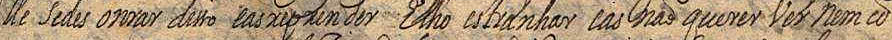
lle se desonrar disso e as reprender E lho estranhar e as não querer Ver nem cō
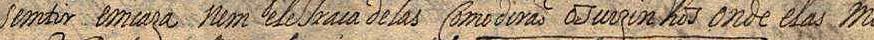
Semtir em caza nem ele Iraça delas Como dirão os uizinhos onde elas mo
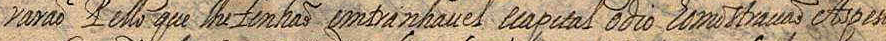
rarão Pello que lhe tinhaõ emtranhauel e capital odio E o mostrauão As peso
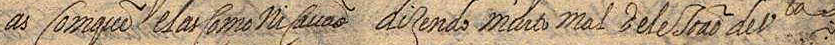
as Com quē elas ComoniCauão dizendo muito mal delle Ioão de Vta
